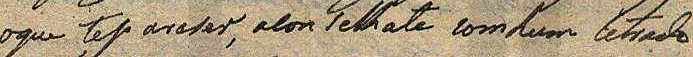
o que te parecer, aconselhate com hum letrado
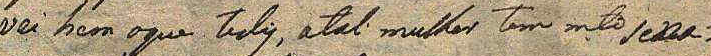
vei bem o que te dis, a tal mulher tem m.to se na
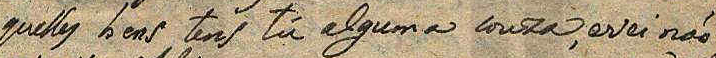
quelles bens tens tú alguma couza, e vei naõ
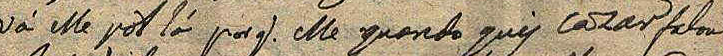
vá elle por lá porq̄. elle quando quis cazar falou
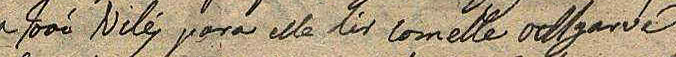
a Joaõ Nilés para elle hir com elle o Algarve
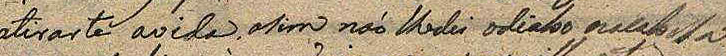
a tirar te a vida, asim naõ lhe dei o diabo na cabesa
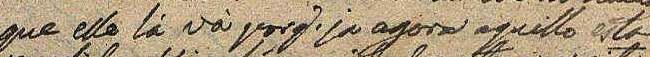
que elle lá vai porq̄. ja agora aquillo esta
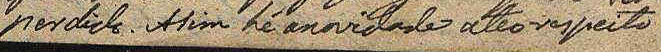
perdido. Asim hé a novidade a teo respeito
